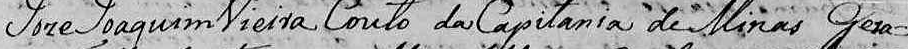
Joze Joaquim Vieira Couto da Capitania de Minas Gera
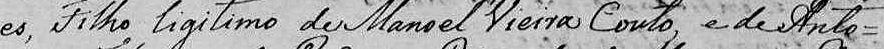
es, Filho ligitimo de Manoel Vieira Couto, e de Anto
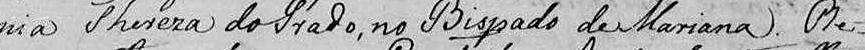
nia Thereza do Prado, no Bispado de Mariana. Re
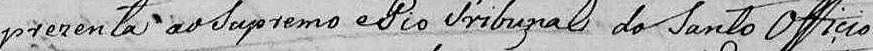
prezenta ao Supremo e Pio Tribunal do Santo Offiçio
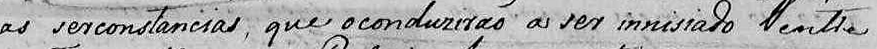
as serconstancias, que o conduziraõ a ser innisiado entre
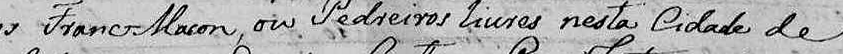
os Franc Macon, ou Pedreiros livres nesta Cidade de
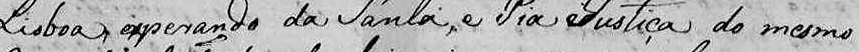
Lisboa, esperando da Santa, e Pia Justiça do mesmo
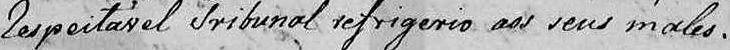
respeitável Tribunal refrigerio aos seus males.
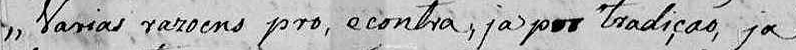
"Varias razoens pro, e contra, ja por tradiçaõ, ja
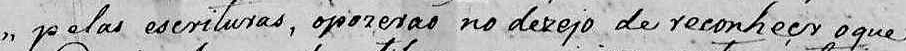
"pelas escrituras, o pozeraõ no dezejo de reconheçer o que
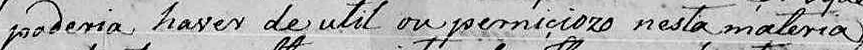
"poderia haver de util ou perniçiozo nesta materia;
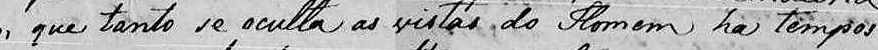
"que tanto se oculta as vistas do Homem ha tempos
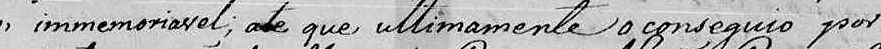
"immemoriavel; ate que ultimamente o conseguio por
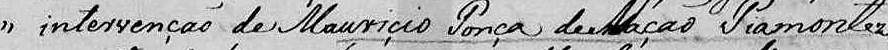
"intervençaõ de Mauriçio Ponça de Naçaõ Piamontez,
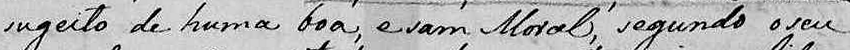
"sugeito de huma boa, e sam Moral, segundo o seu
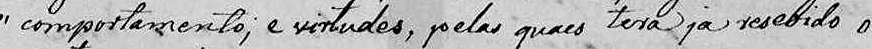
"comportamento; e virtudes, pelas quaes tera ja resebido o
